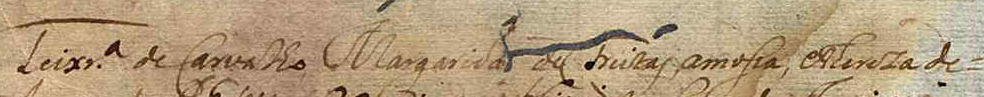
Teixr.a de Carvalho Margarida de Freitas a mossa, e Thereza de
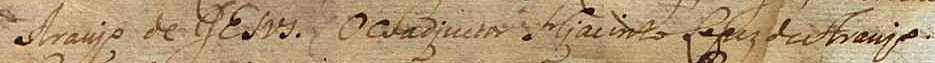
Araujo de JESVs. O coadjuctor Hjacinto Lopez de Araujo.
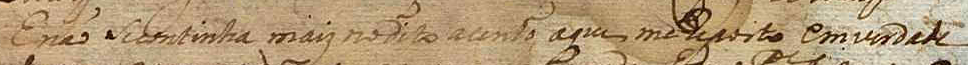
E naõ se continha mais no dito acento, a que me Reporto em verdade
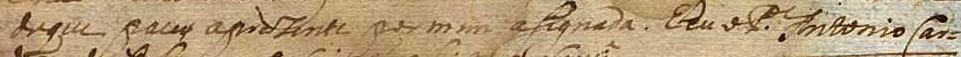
do que pacey a prezente por mim asignada. E eu o P.e Antonio Car
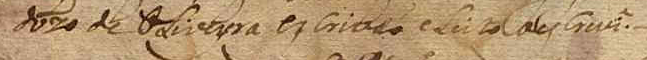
dozo de Oliveyra escriuaõ eLeito o esCrevi.
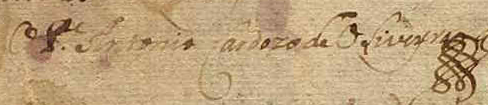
O P.e Antonio Cardozo de Oliveyra
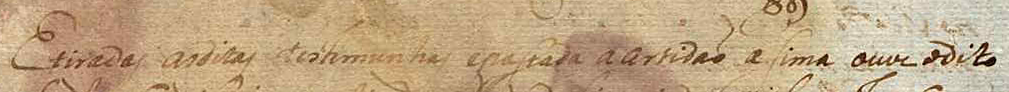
E tiradas as ditas testemunhas e passada a certidaõ asima ouve o dito
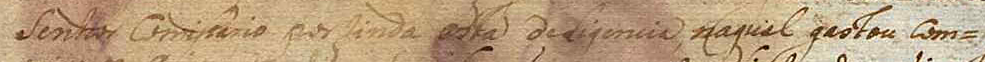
Senhor Comissario por finda esta deLigencia, na qual gastou com
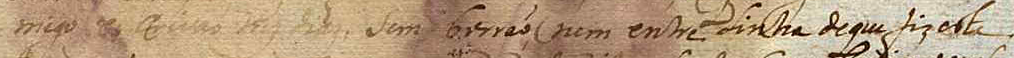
migo Escriuao trez diaz, sem borraõ, nem entreLinha de que fiz este
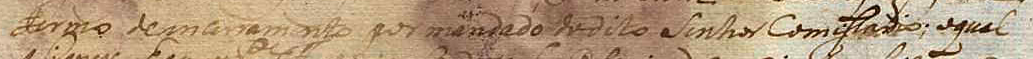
termo de encerramento por mandado do dito Senhor Comissario; o qual
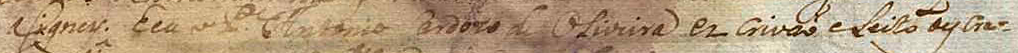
asigney. E eu o P.e Antonio Cardozo de Oliveira escrivaõ eLeito o escre
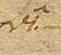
vi.
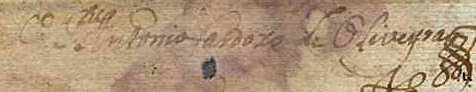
O P.e Antonio Cardozo de Oliveyra
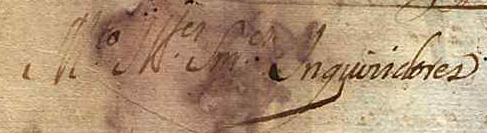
M.to Ill.es snr.es Inquizidores
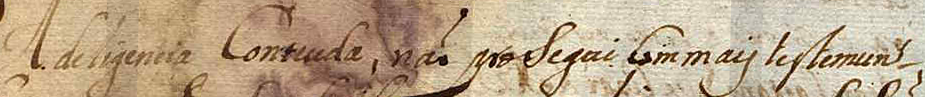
A deligencia Conteuda, naõ proSegui Com mais testemun
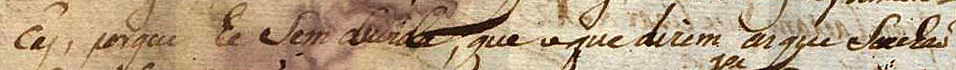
has, porque he Sem duvida, que o que dizem as que Se achaõ
